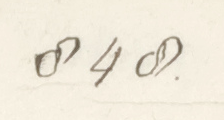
848.
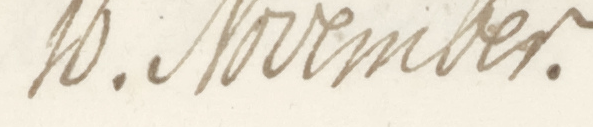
16 November.
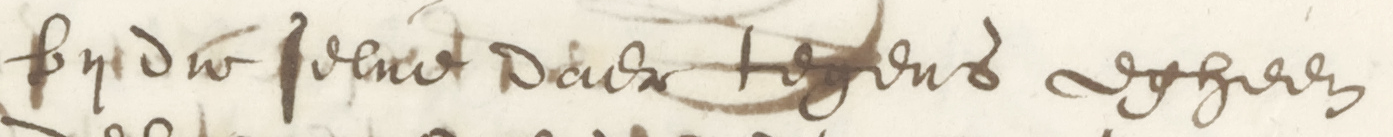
by die selue daer tegens egheen
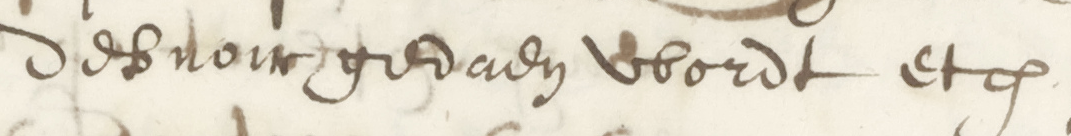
debuoir gedaen wordt etc.
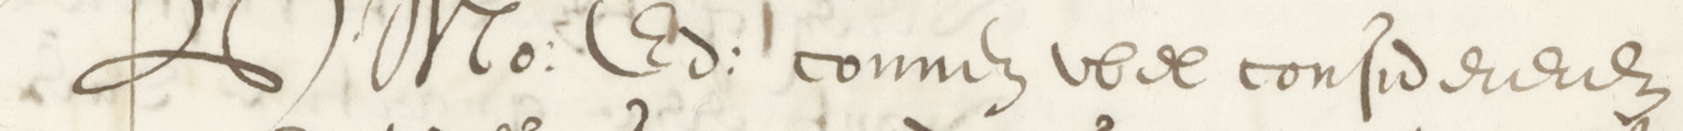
U Mo:Ed: connen wel consideren
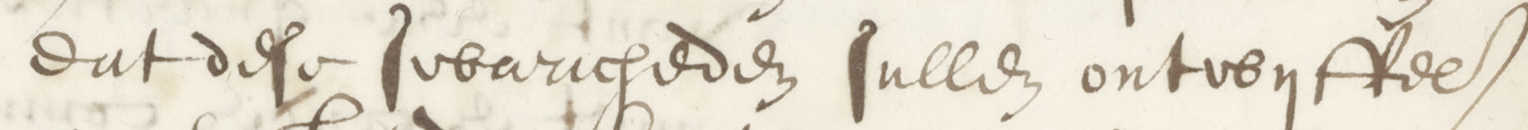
dat dese swaricheden sullen ontwyffel
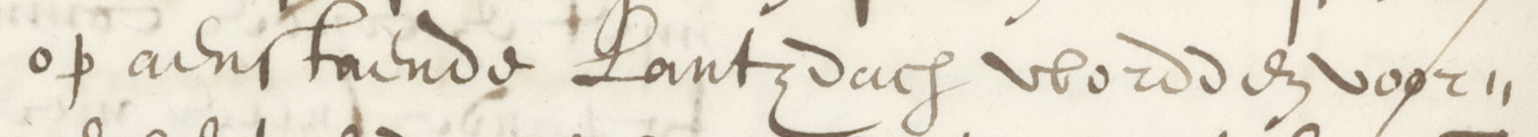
op aenstaende Lantzdach wordden voor„
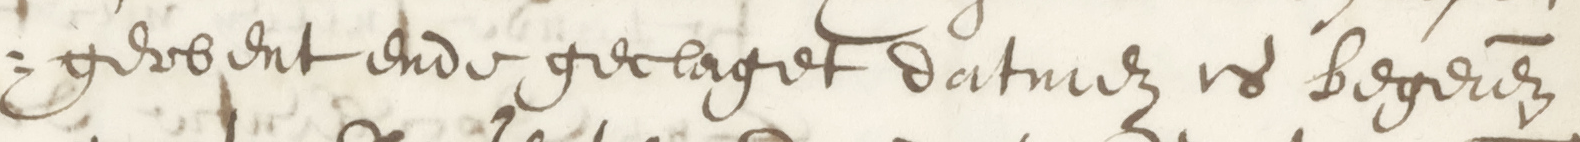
„gewent ende geclaget datmen is begeren
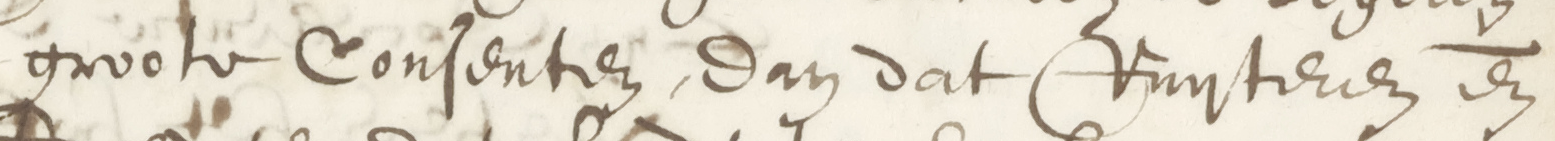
groote Consenten, dan dat Ruyteren en
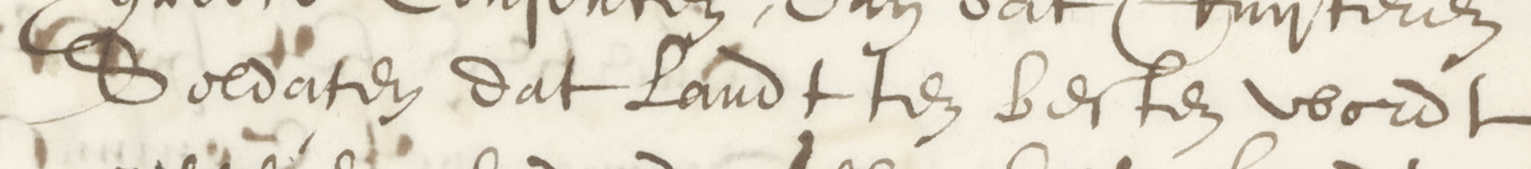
Soldaten dat Landt ten besten wordt
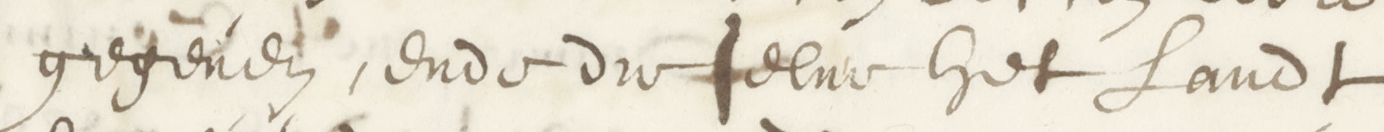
gegeuen, ende dieselue het Landt
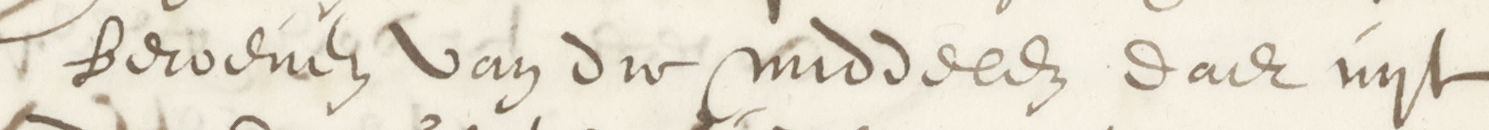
beroeuen van die middelen daer uyt
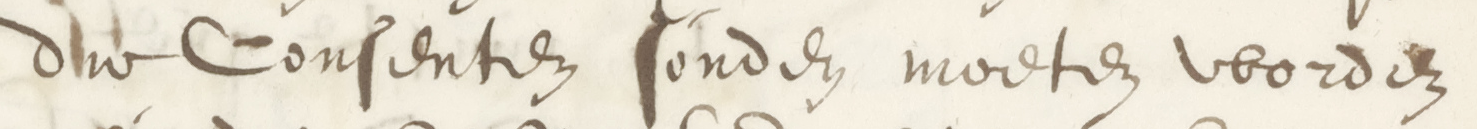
die Consenten souden moeten worden
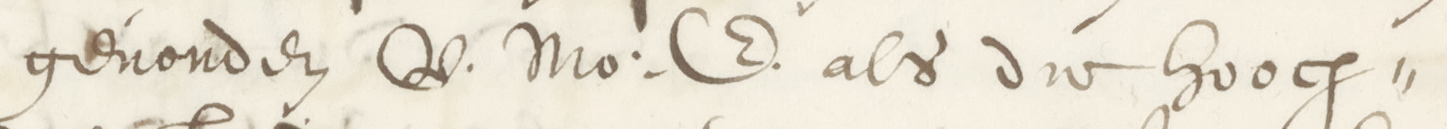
geuonden U. Mo:E: als die hooch„
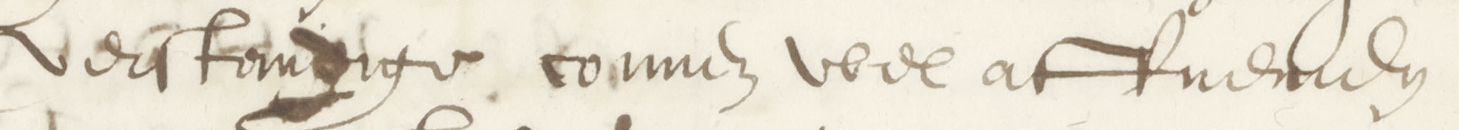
verstandige connen wel affnemen
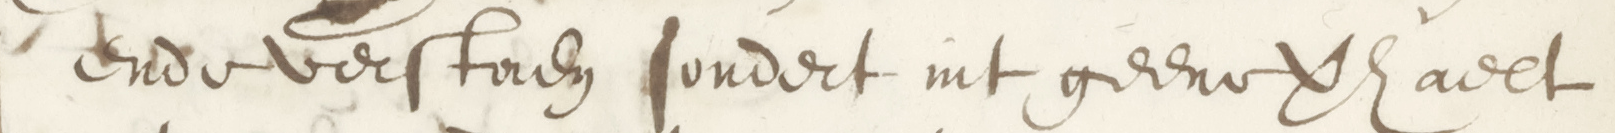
ende verstaen sondert int geene vhaelt
